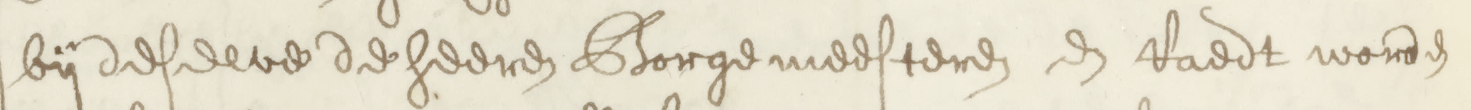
bij deselve de heeren Borgemeesteren en Raedt worden
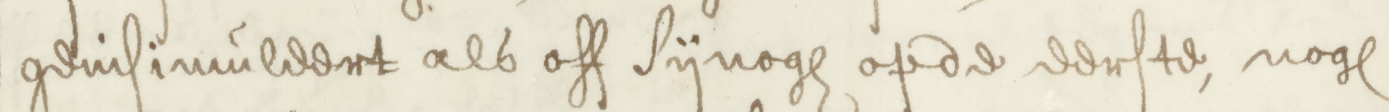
geinsimuleert als off Sij nogh opde eerste, nogh
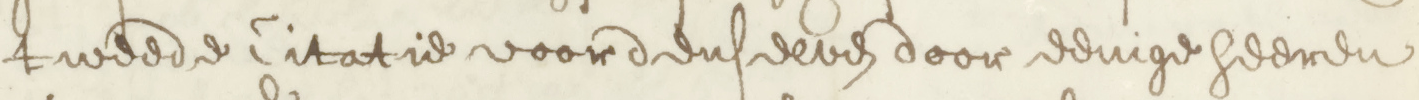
tweede Citatie voor denselven door eenige heeren
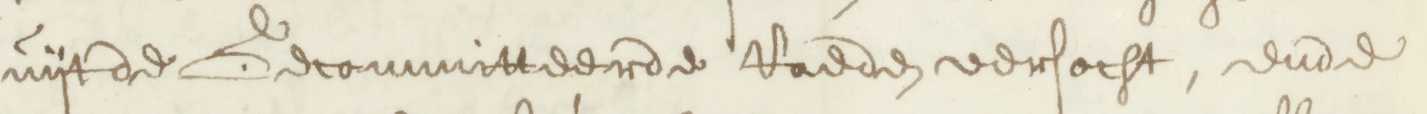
uijt de Gecommitteerde Raeden versocht, ende
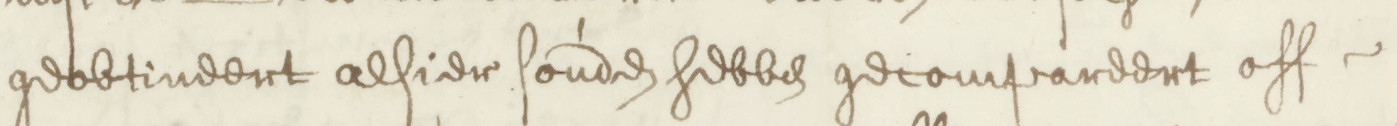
geobtineert alhier souden hebben gecompareert off
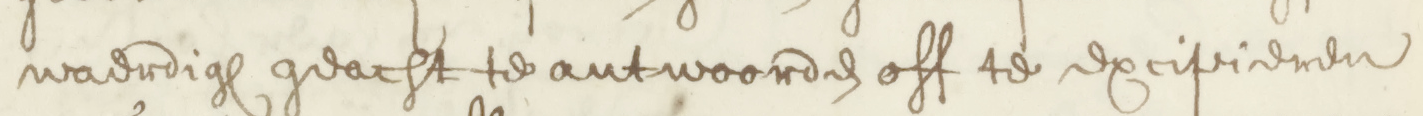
waerdigh geacht te antwoorden off te excipieren
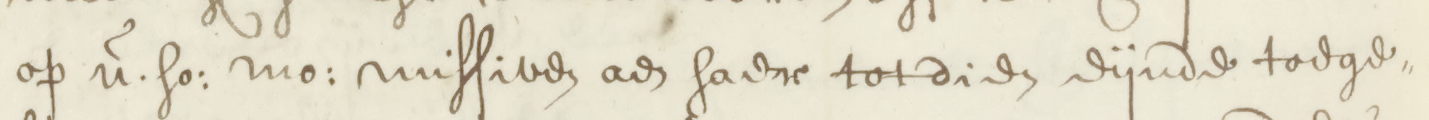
op u. ho:mo: missiven aen haer tot dien eijnde toege„
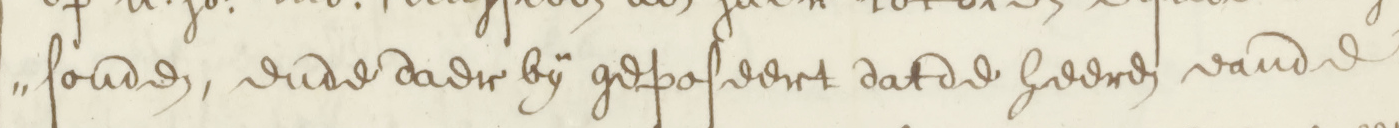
„sonden, ende daer bij geposeert dat de heeren vande
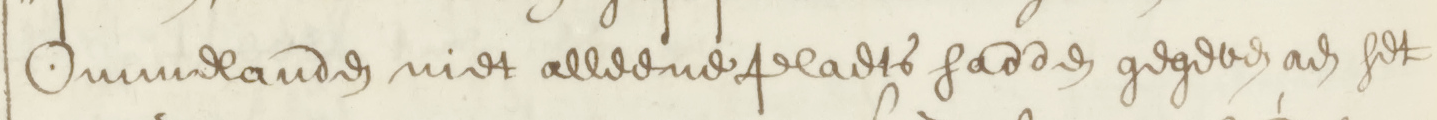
Ommelanden niet alleene plaets hadden gegeven aen het
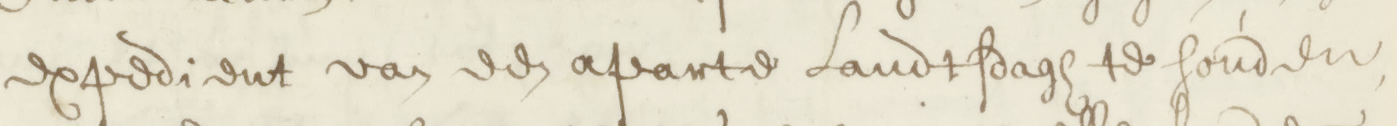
expedient van een aparte Landtsdagh te houden,
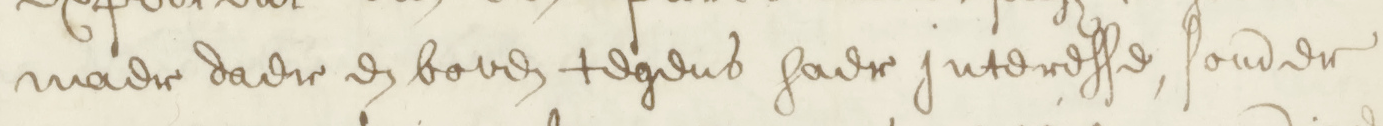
maer daer en boven tegens haer interesse, sonder
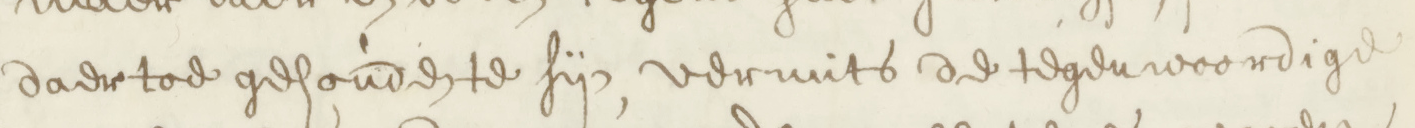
daertoe gehouden te sijn, vermits de tegenwoordige
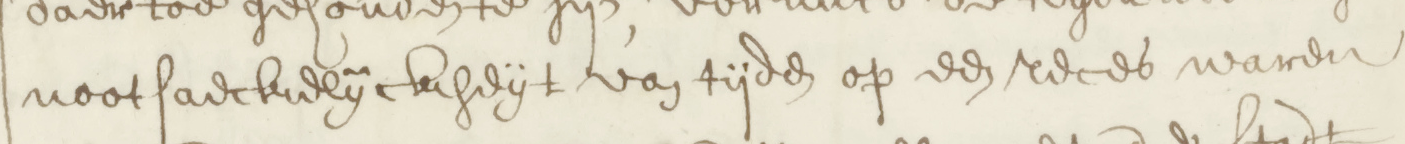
nootsaeckelijckheijt van tijden op een reces waren
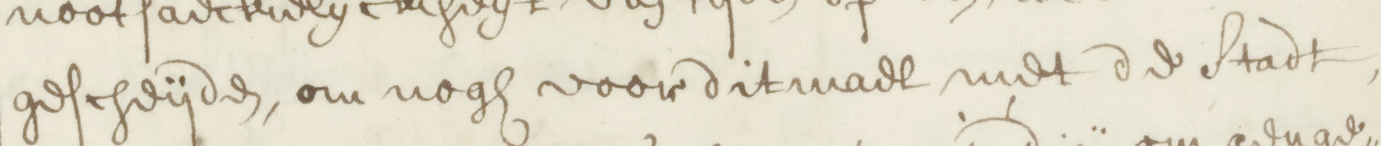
gescheijden, om nogh voor dit mael met de Stadt,
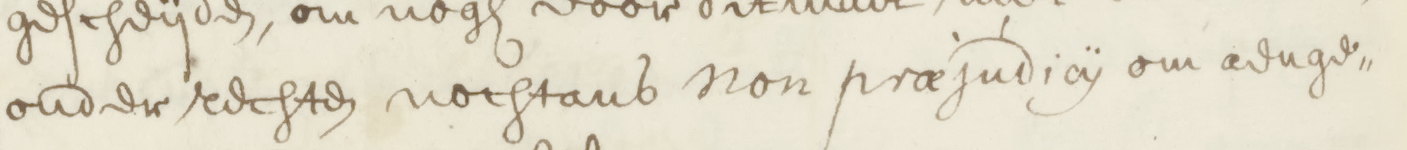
onder rechten nochtans Non præjudicij om aenge„
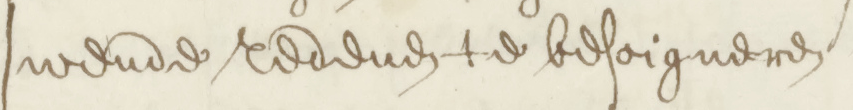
wende redenen te besoigneren.
